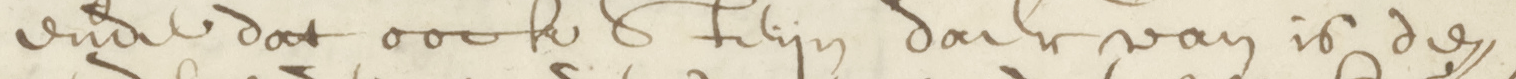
ende dat oock Steijn daer van is de„
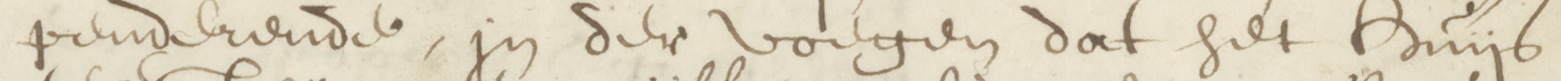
penderende, in der voegen dat het Huijs
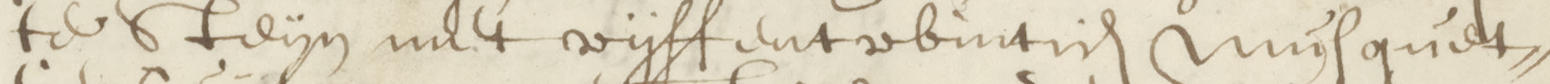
te Steijn met vijffentwintich Musquet„
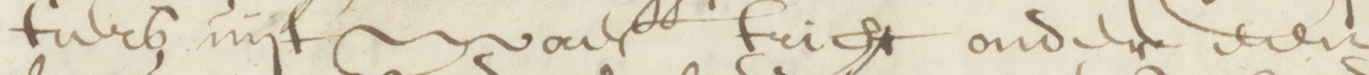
tiers uijt Maestricht onder een
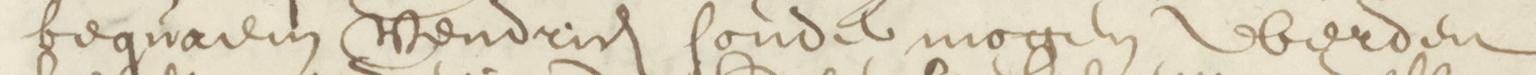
bequaem Vendrich soude mogen werden
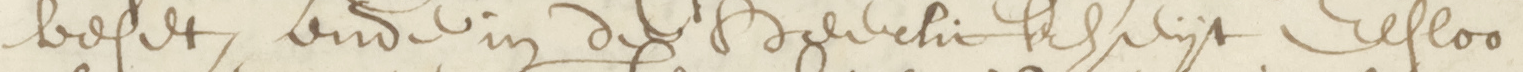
beset, ende in de Heerlickheijt Elsloo
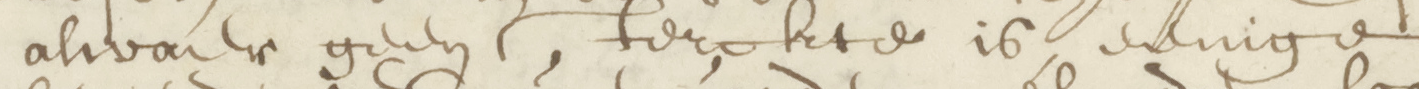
alwaer geen sterckte is, eenige
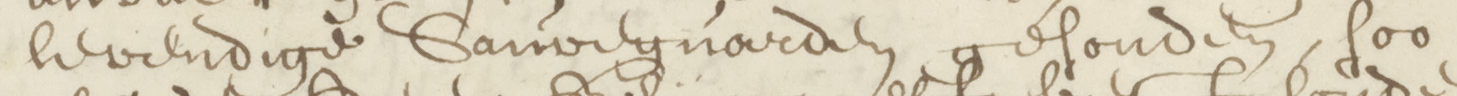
levendige Sauveguarden gesonden, soo
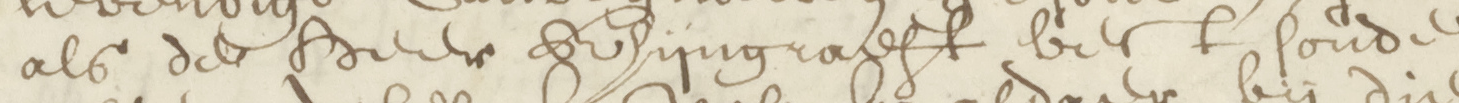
als de Heer Rhijngaeft aldaer soude
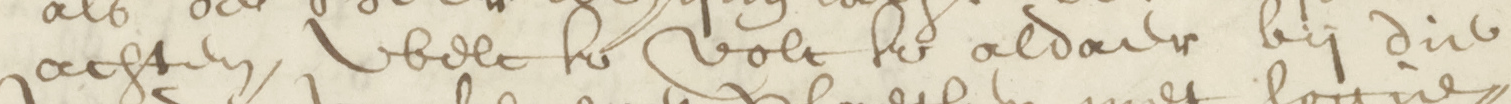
achten, Welck volck aldaer bij die
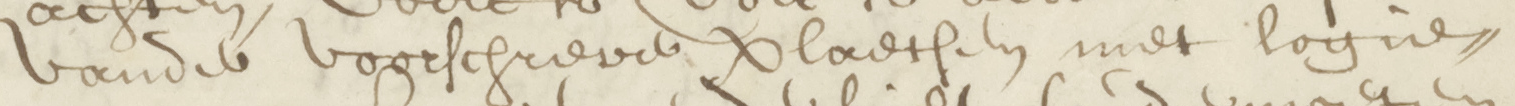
vande voorschreve Plaetsen met logie„
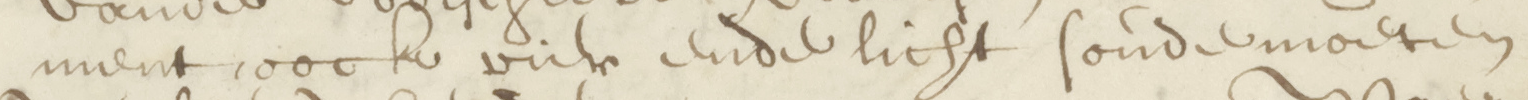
ment, oock vuer ende licht soude moeten
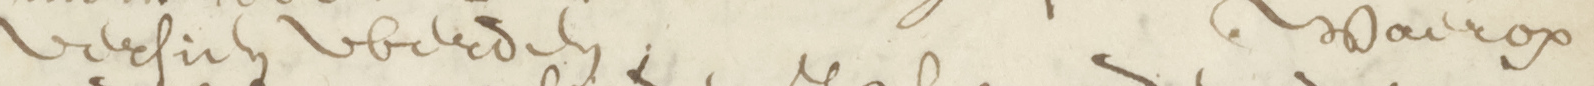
versien werden; Waerop
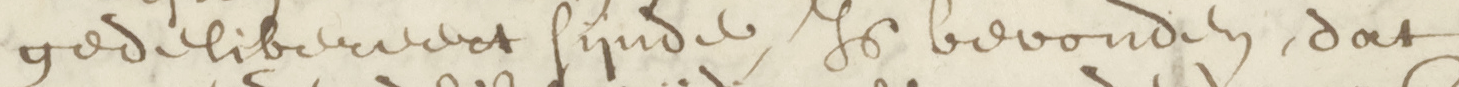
gedelibereert sijnde, Is bevonden, dat
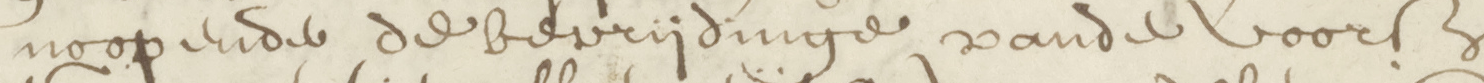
noopende de bevrijdinge vande voors
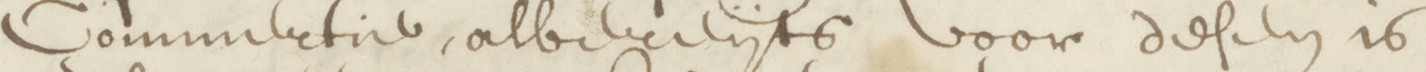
Commertie, albereijts voor desen is
